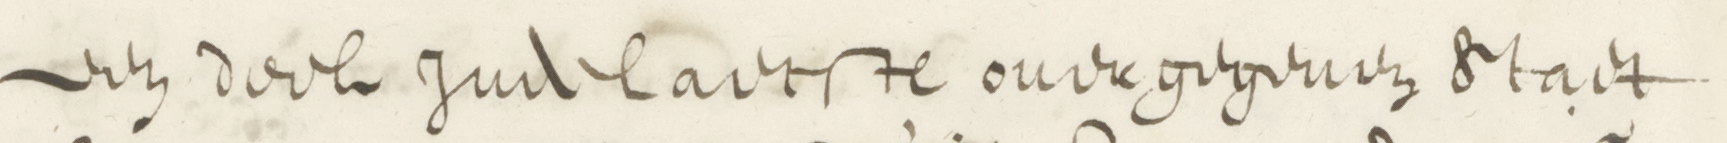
een deel inde laetste ouergegeuen staet
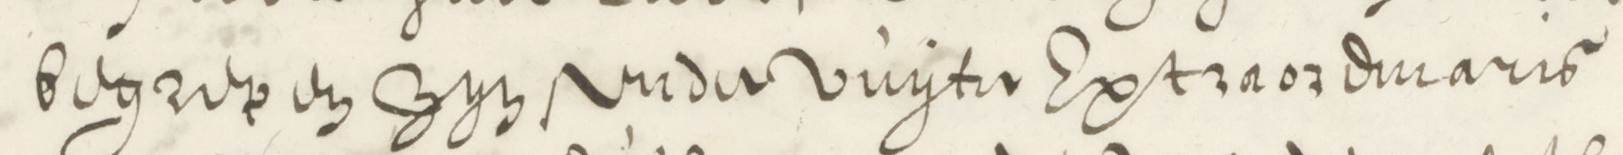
begrepen zijn ende vuijte Extraordinaris
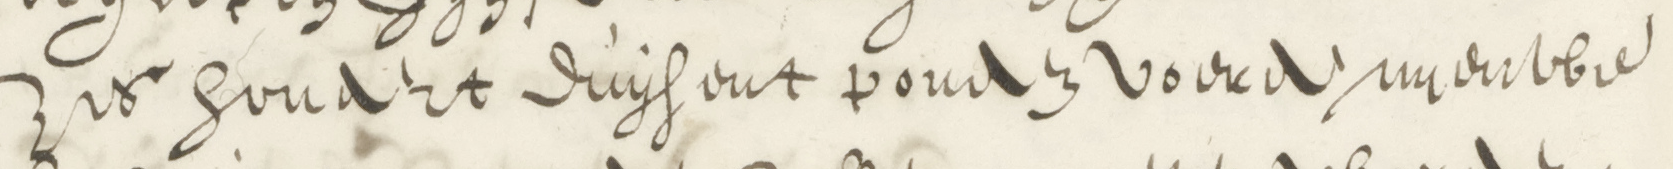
zes hondert duijsent ponden voerde nyeuwe
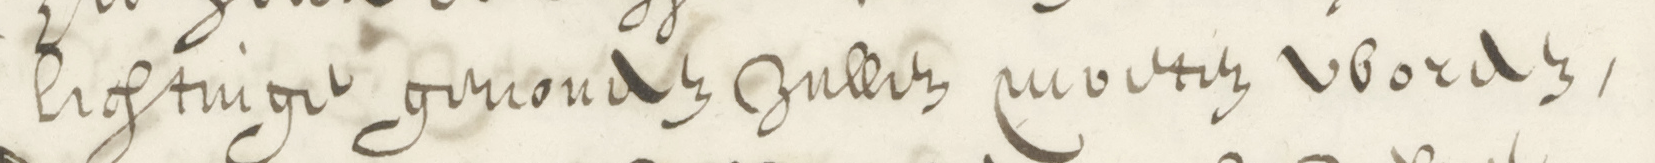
lichtinge geuonden zullen moeten worden,
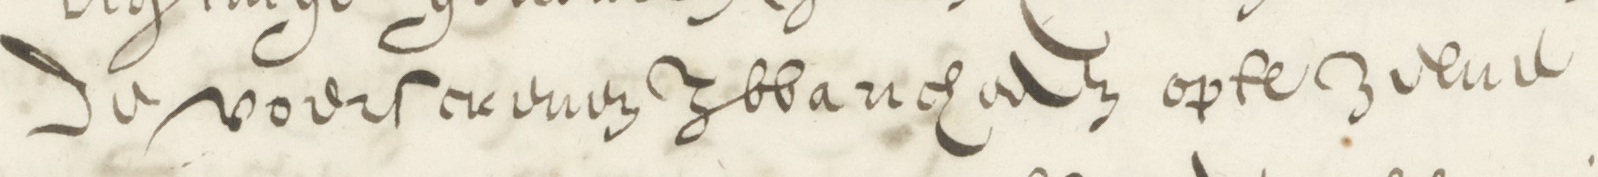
de voerscreuen zwaricheden opte zelue
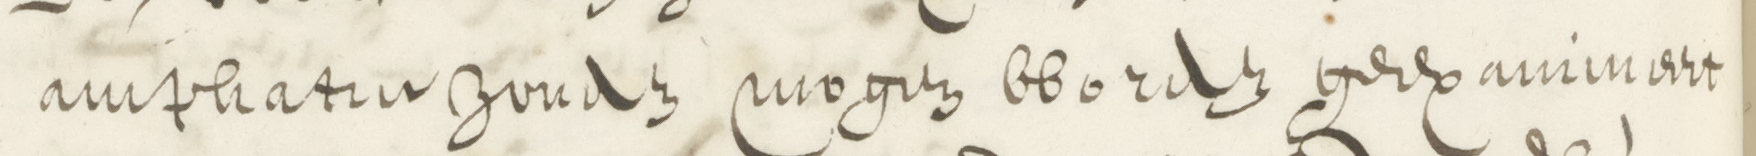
ampliatie zouden mogen worden geexamineert
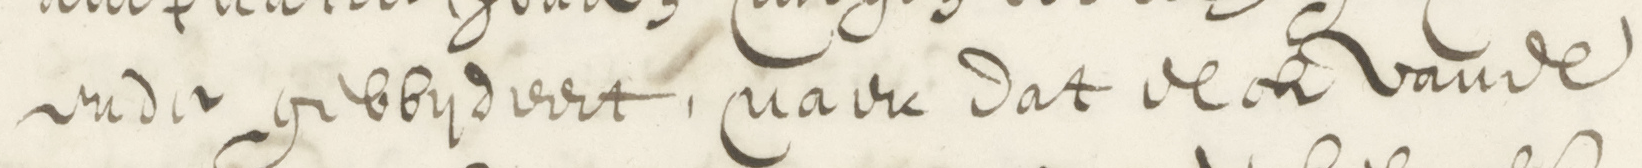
ende gewydeert naer dat elck vande
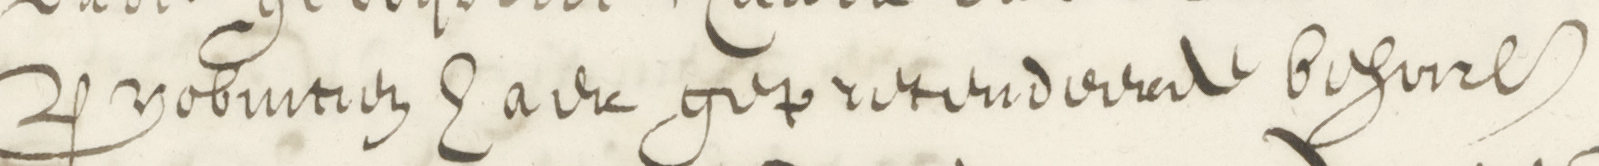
Provintien haer gepretendeerde behoirl
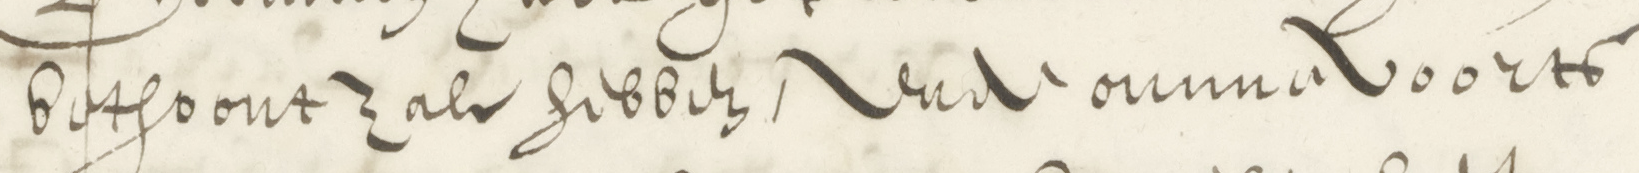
bethoont zal hebben. Ende omme voorts
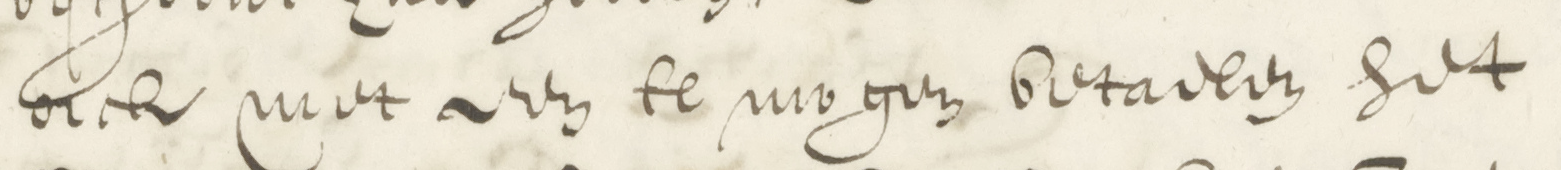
oick met een te mogen betaelen het
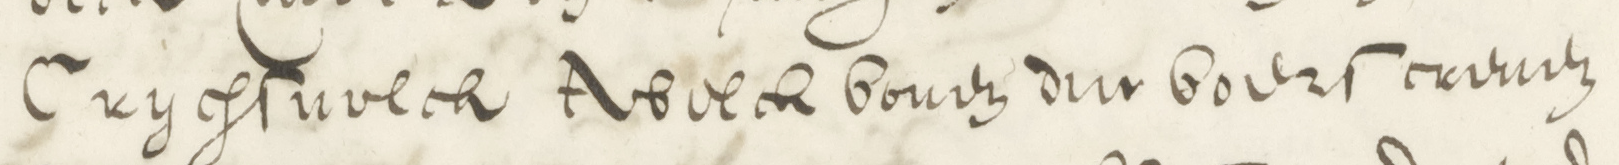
crychsvolck twelkck bouen die voerscreven
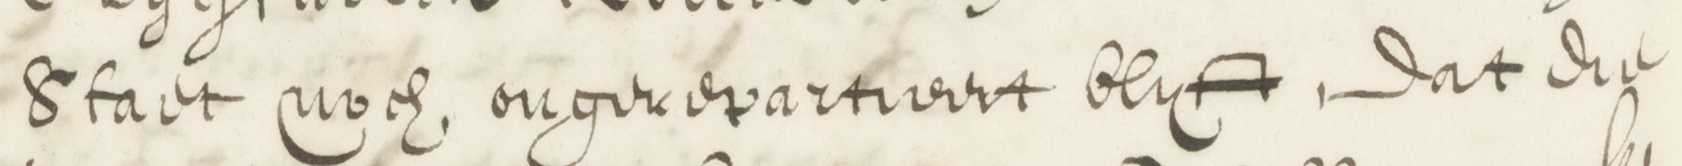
staet noch ongerepartieert blyft, dat die
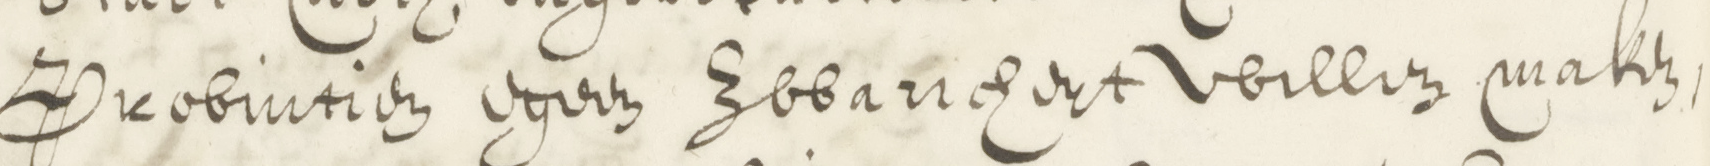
Provintien egeen zwaricheyt willen maken,
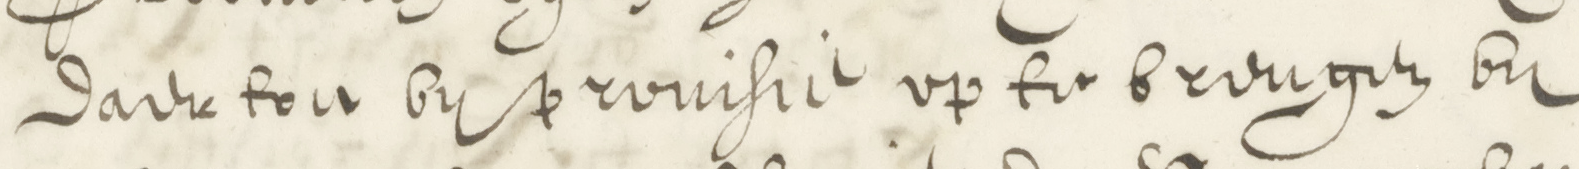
daer toe bij prouisie op te brengen by
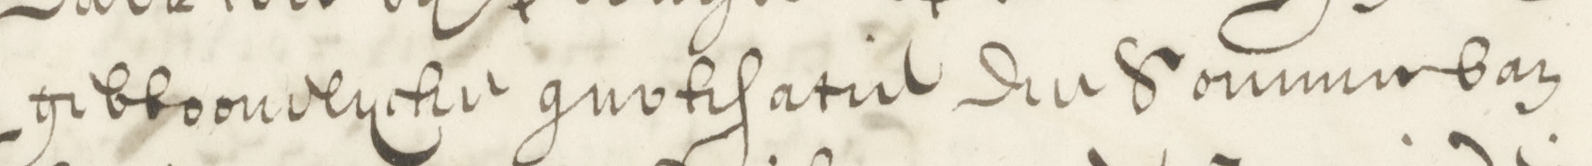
gewoonelycke quotisatie die somme van
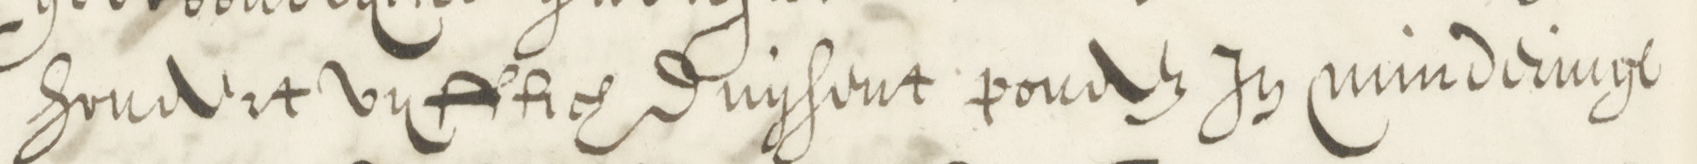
hondert vyftich duijsent ponden in minderingh
